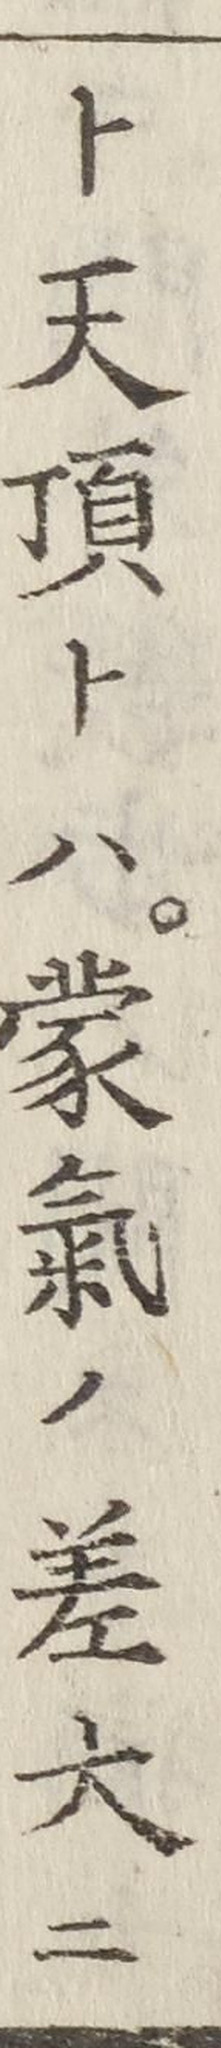ト天頂トハ。蒙気ノ差大ニ
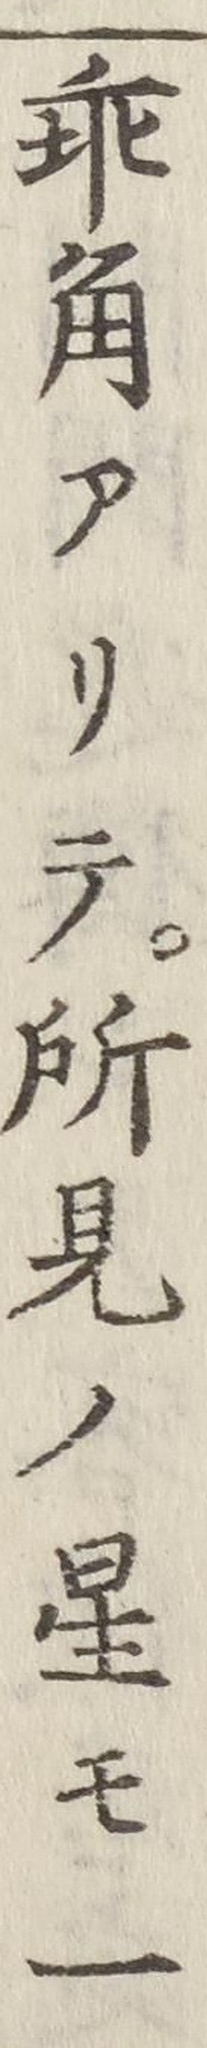乖角アリテ。所見ノ星モ一
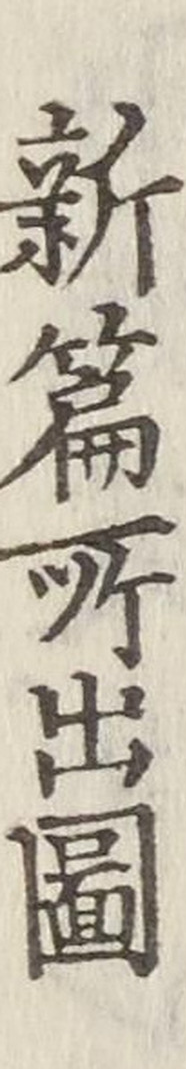新篇所出図
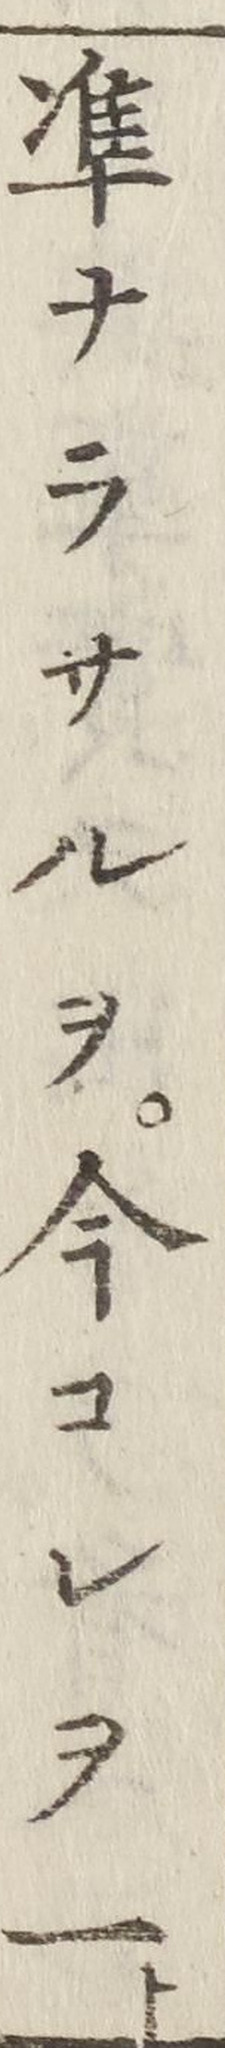準ナラサルヲ。今コレヲ一
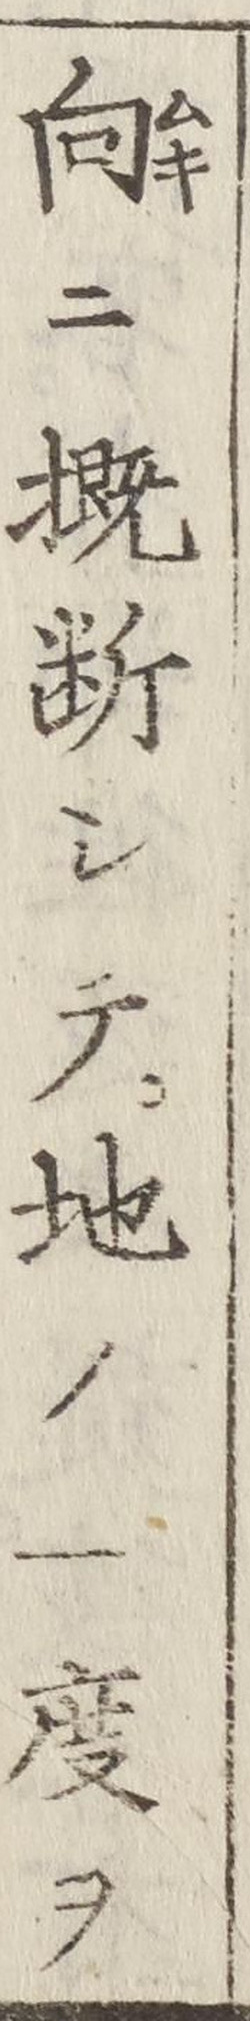向ニ概断シテ。地ノ一度ヲ
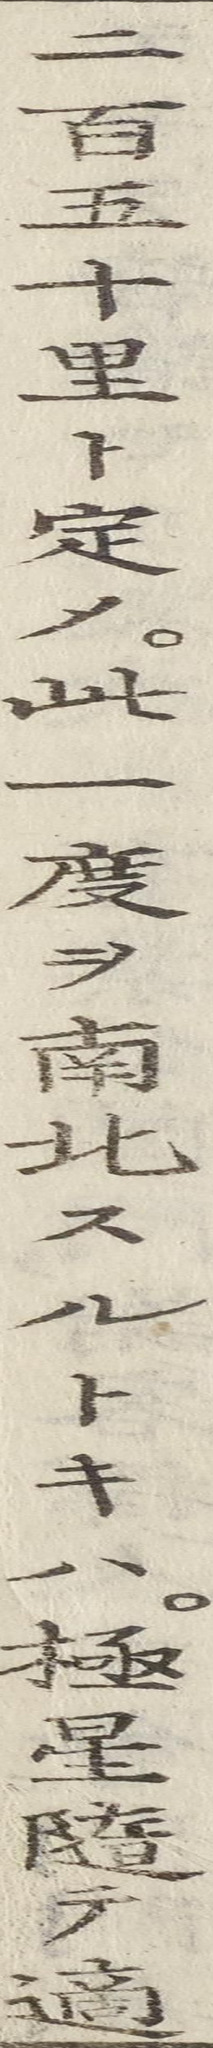二百五十里ト定メ。此一度ヲ南北スルトキハ。極星随テ適
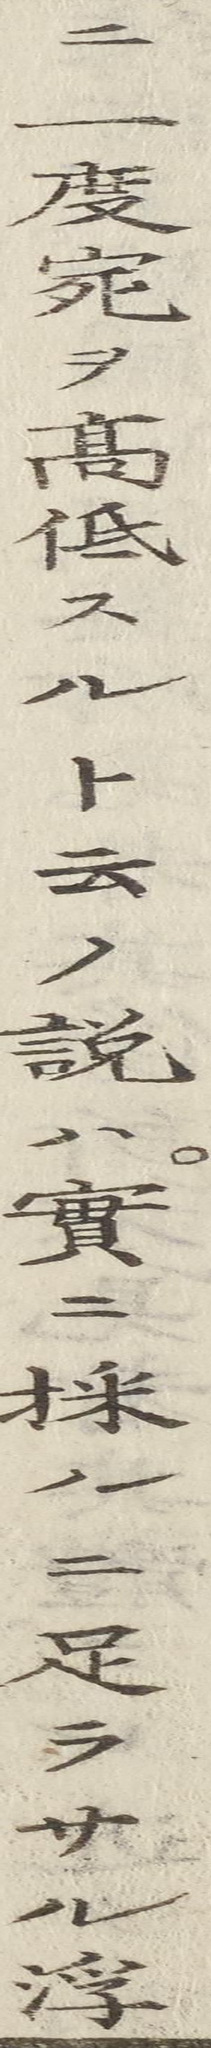ニ一度宛ヲ高低スルト云ノ説ハ。実ニ採ルニ足ラサル浮
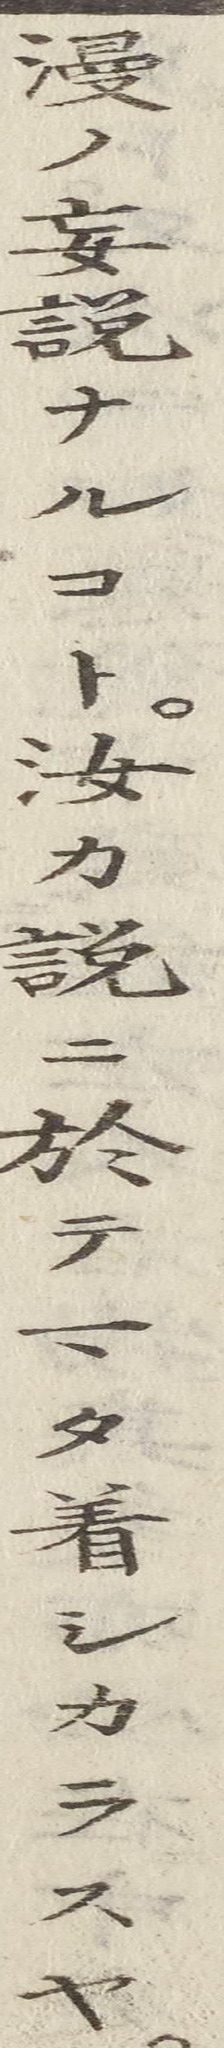漫ノ妄説ナルコト。汝カ説ニ於テマタ着シカラスヤ。
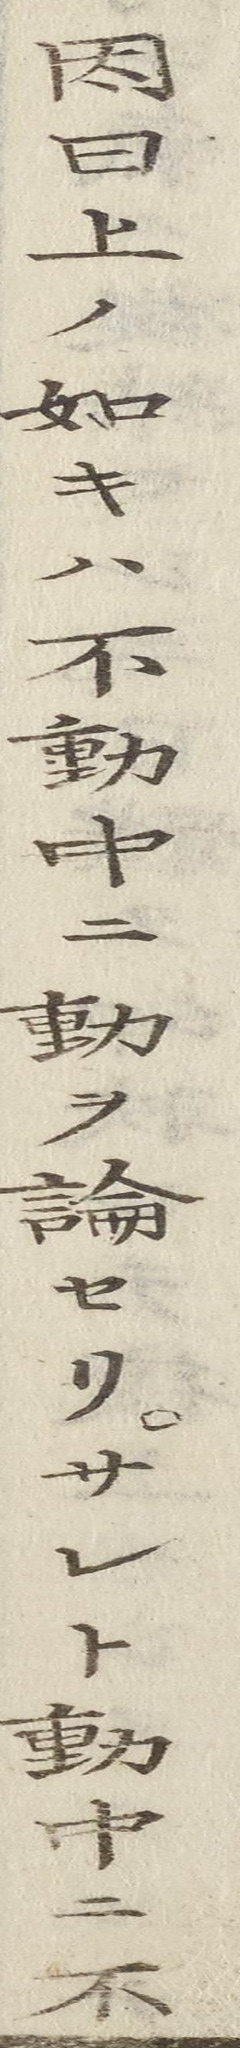因曰上ノ如キハ不動中ニ動ヲ論セリ。サレト動中ニ不
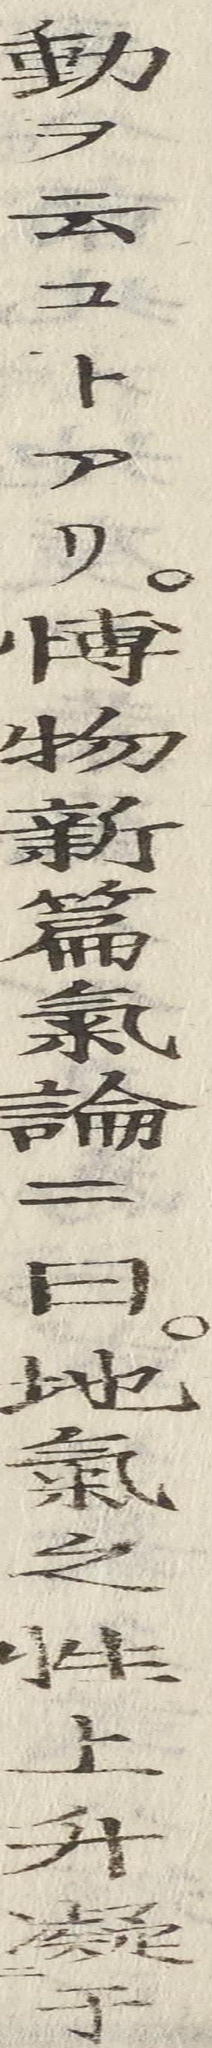動ヲ云コトアリ。慱物新篇気論ニ曰。地気之性上升凝ニ干
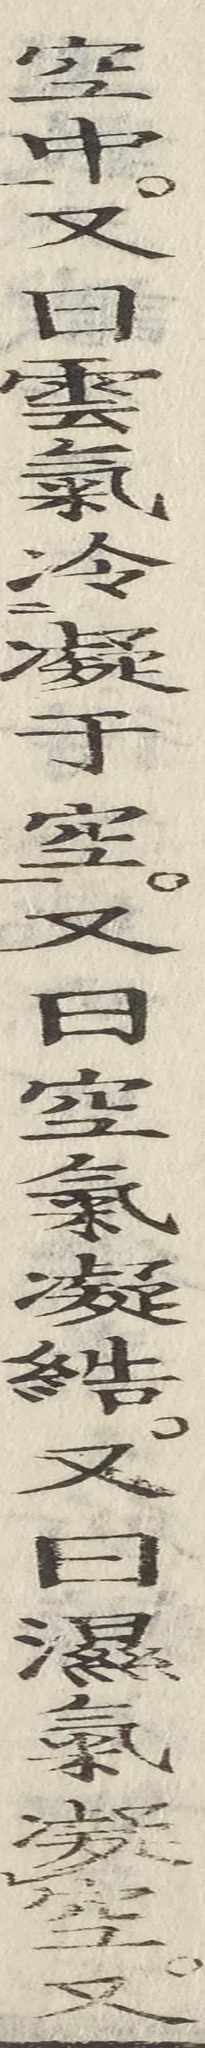空中。又日雲気冷ニ凝干空。又日空気凝結。又日湿気凝空。又
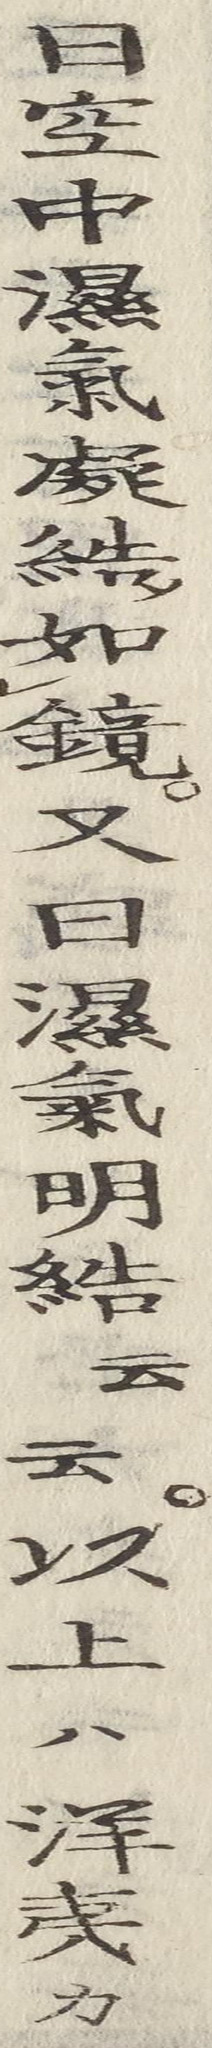日空中湿気凝結如鏡。又日湿気明結云云。以上ハ洋夷カ
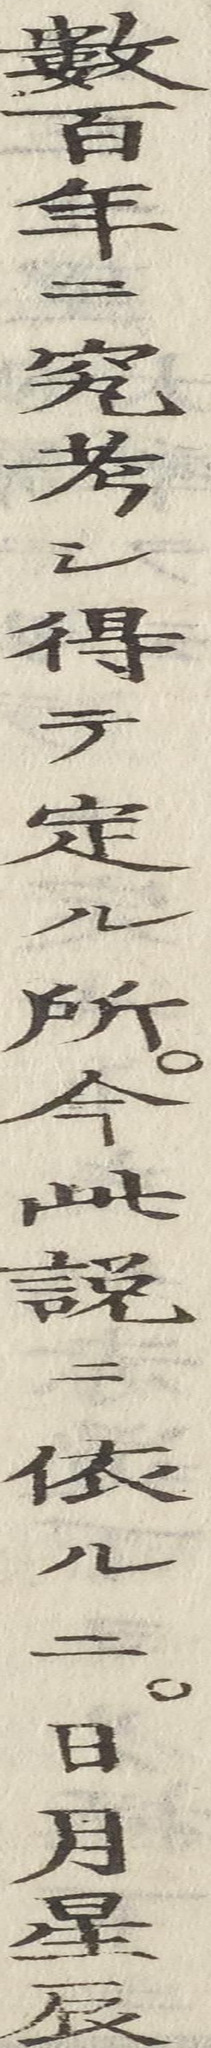数百年ニ究考シ得テ定ル所。今此説ニ依ルニ。日月星辰
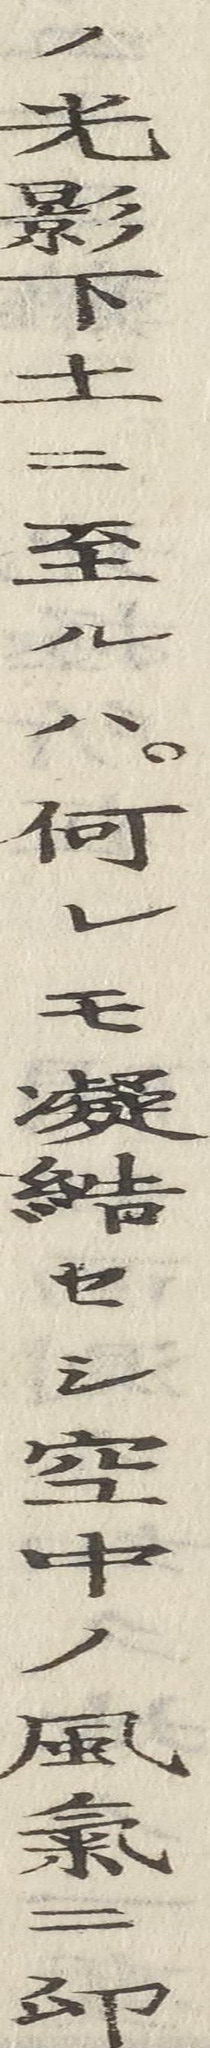ノ光影下土ニ至ルハ。何レモ凝結セシ空中ノ風気ニ卬
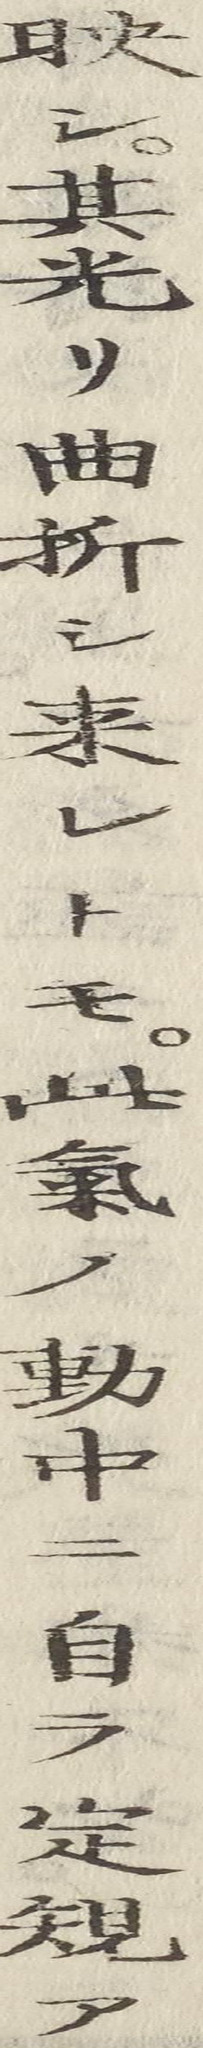映シ。其光リ曲折シ来レトモ。此気ノ動中ニ自ラ定規ア
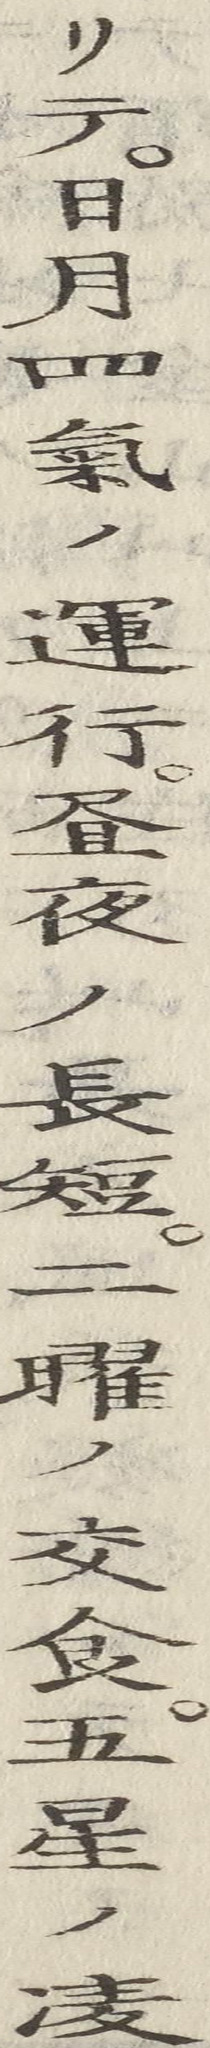リテ。日月四気ノ運行。昼夜ノ長短。ニ曜ノ交食。五星ノ凌
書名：護法新論　二編　中
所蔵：東京大学地震研究所図書室 Earthquake Research Institute Library, The University of Tokyo, JAPAN
